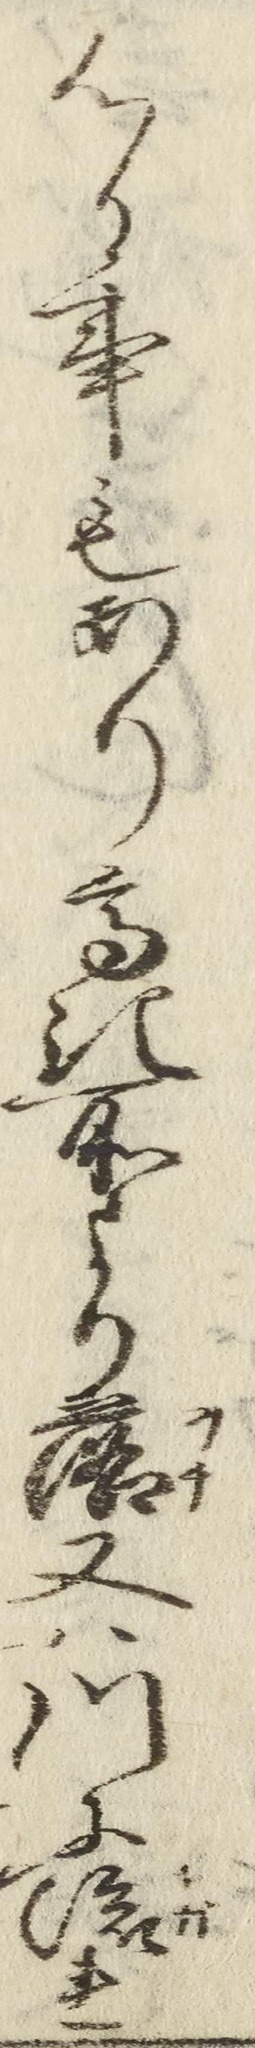心しる事もあり高き所より落又は川に流れ
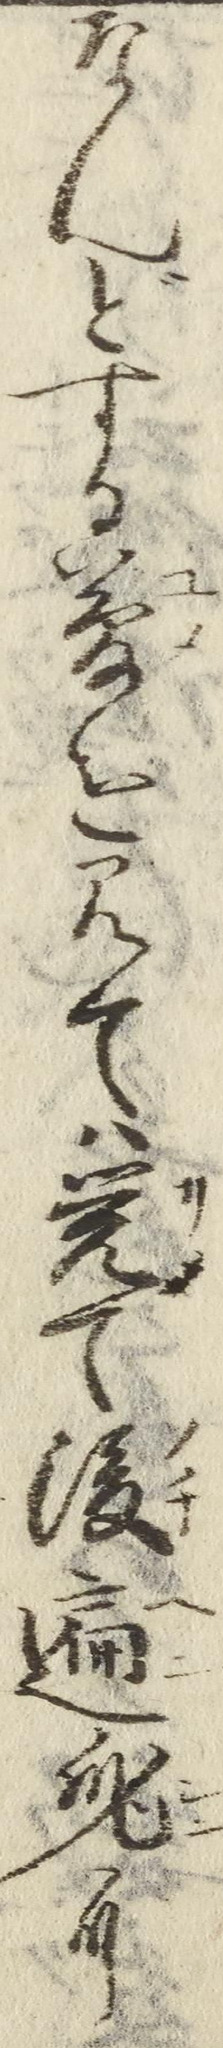なんどする夢を見ては覚て後遍身身
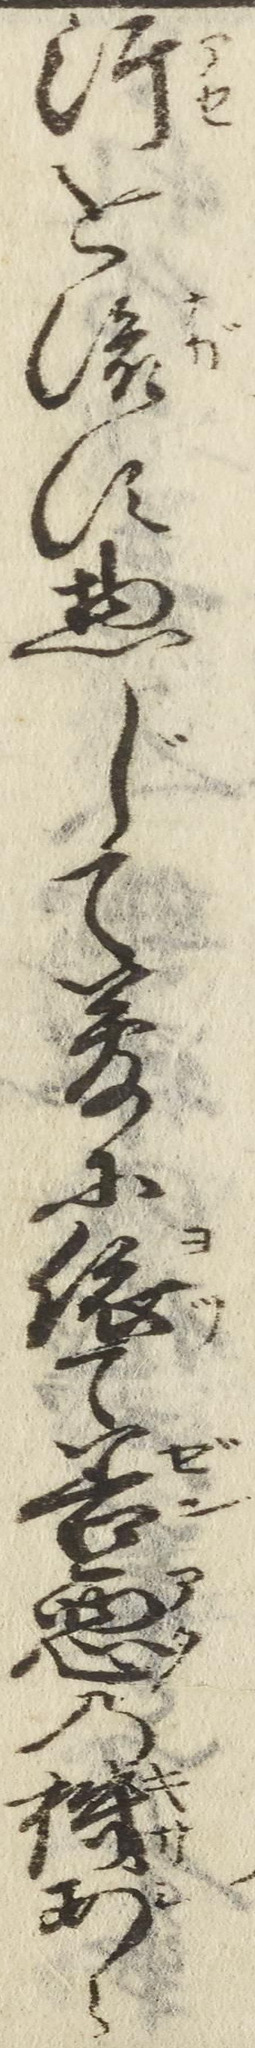汗を流す惣じて夢に依て善悪の機あら

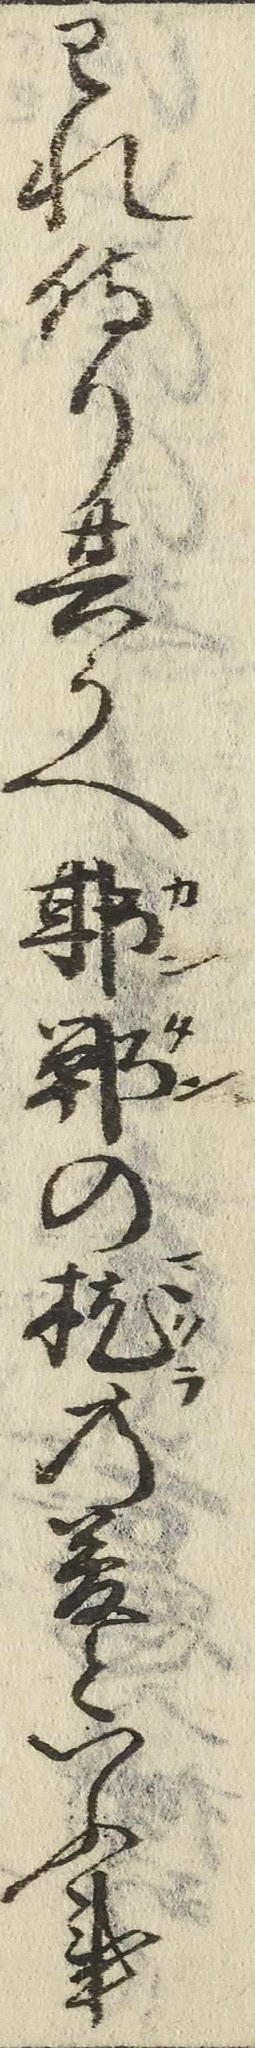われ侍り其うへ邯鄲の枕の夢といふ事
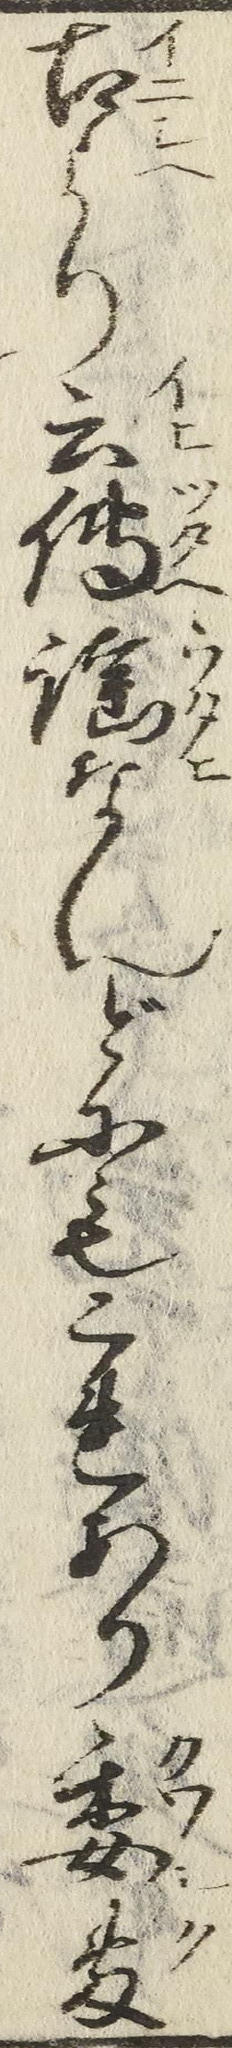古より云伝謡なんどにもこれあり委敷
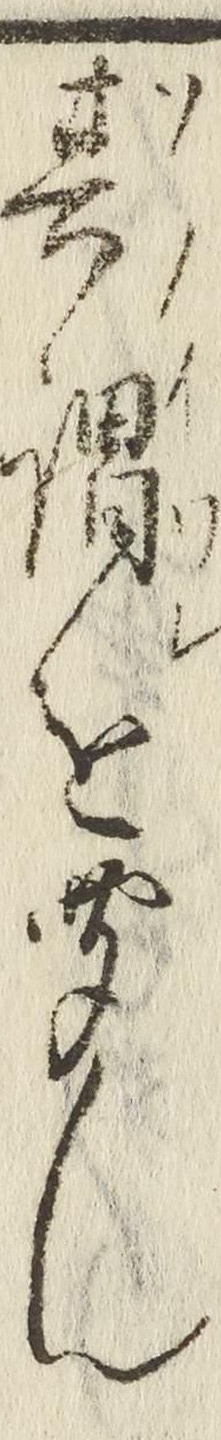其謂を聞ん
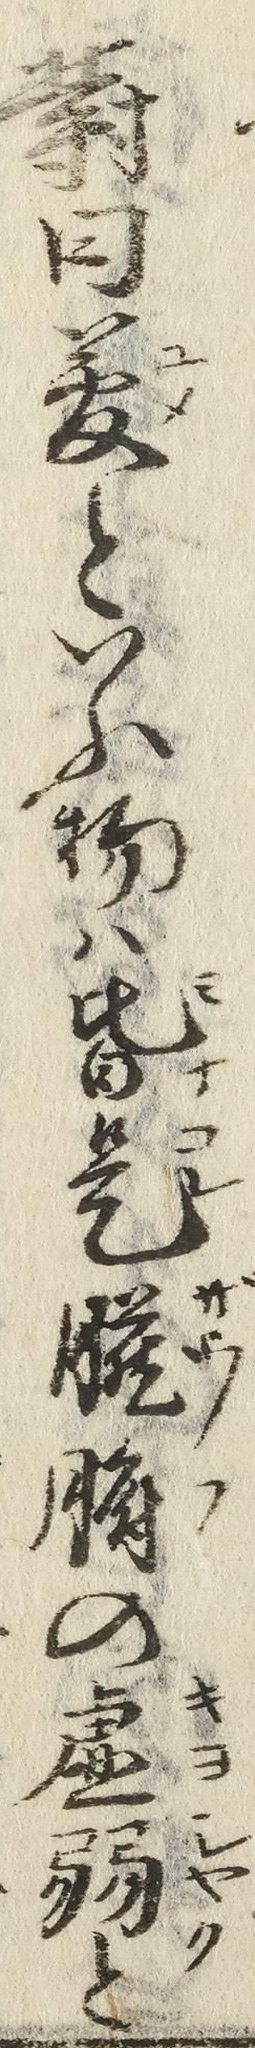対曰夢といふ物は皆是臓腑の虚弱と
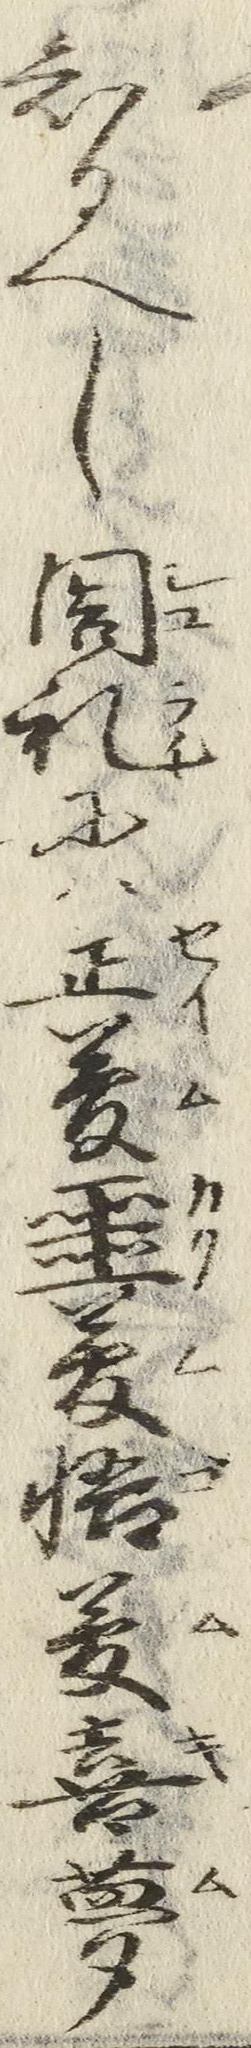知るへし周礼には正夢噩夢悟夢喜夢
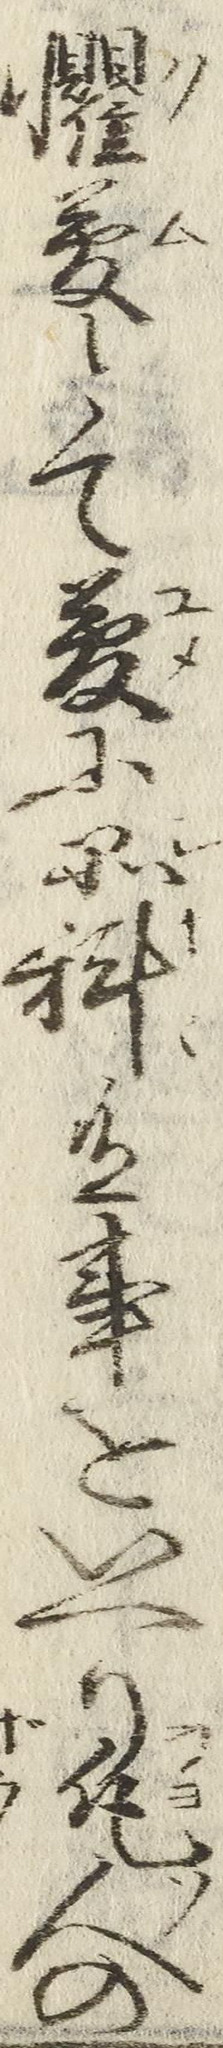懼夢とて夢に品科有事をいへり凡人の
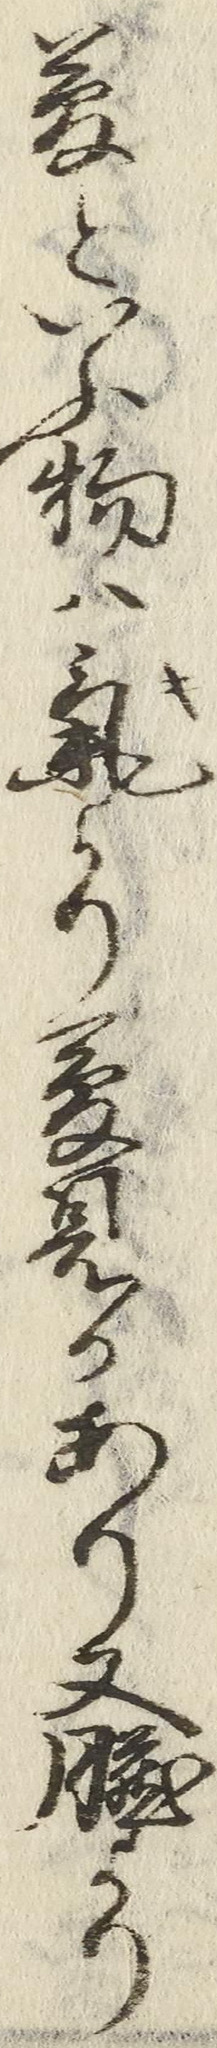夢といふ物は気より夢見かあり又臓より
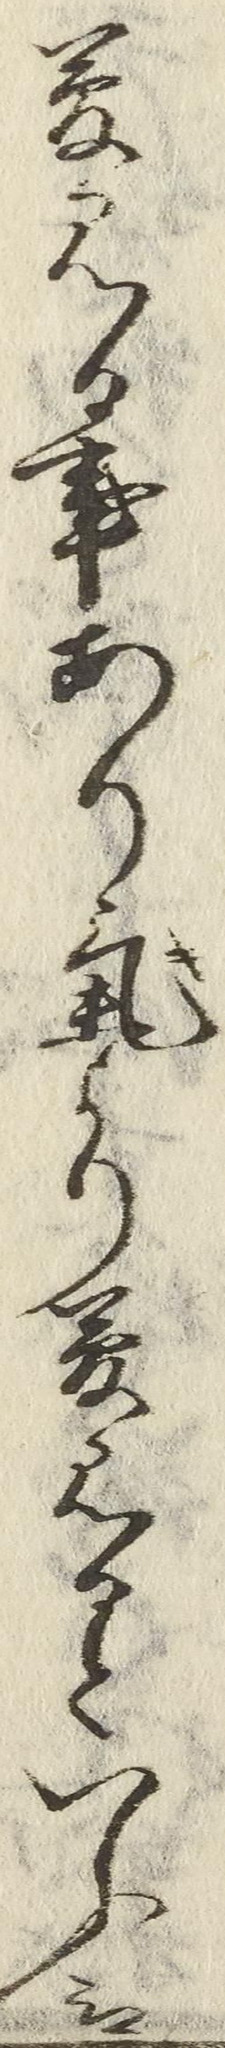夢見る事あり気より夢見るといふは
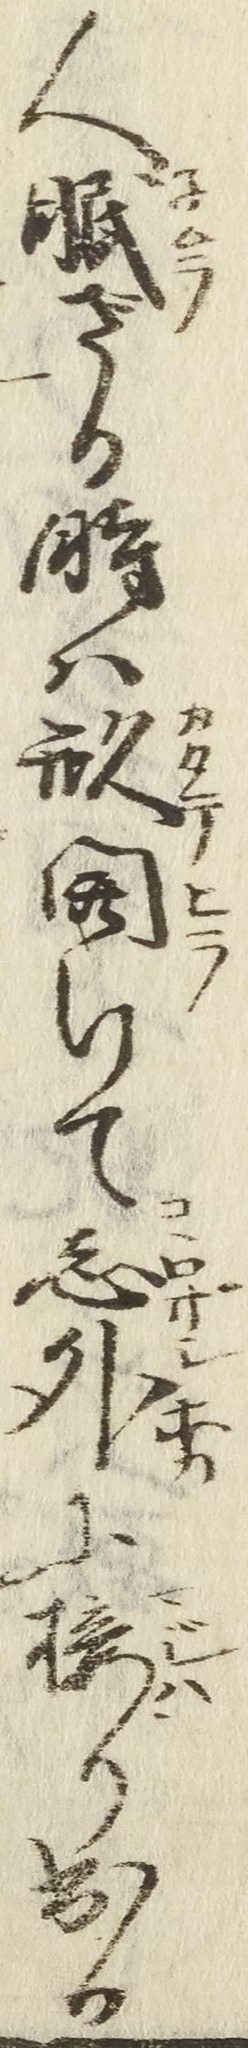人眠ざる時は形開いて志外に接り出る
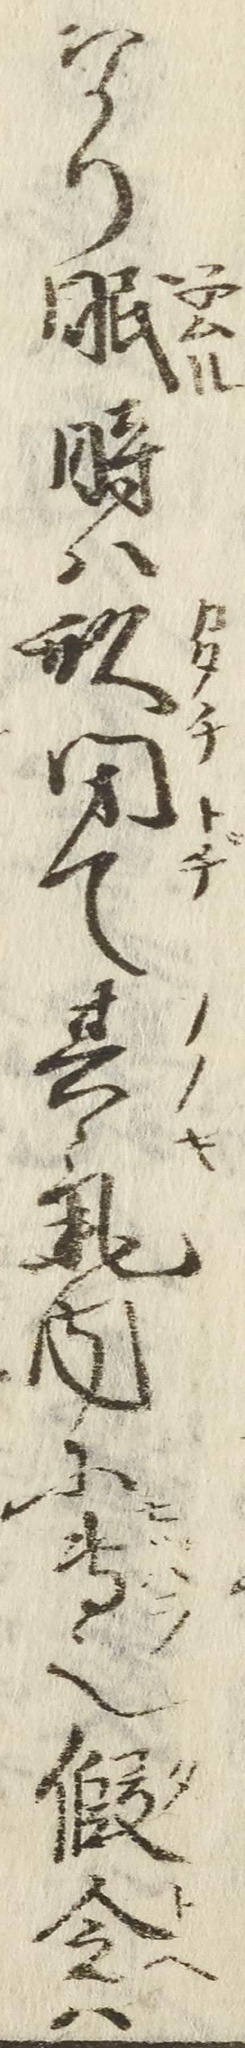なり眠時は形閉て其気内に専也仮令は
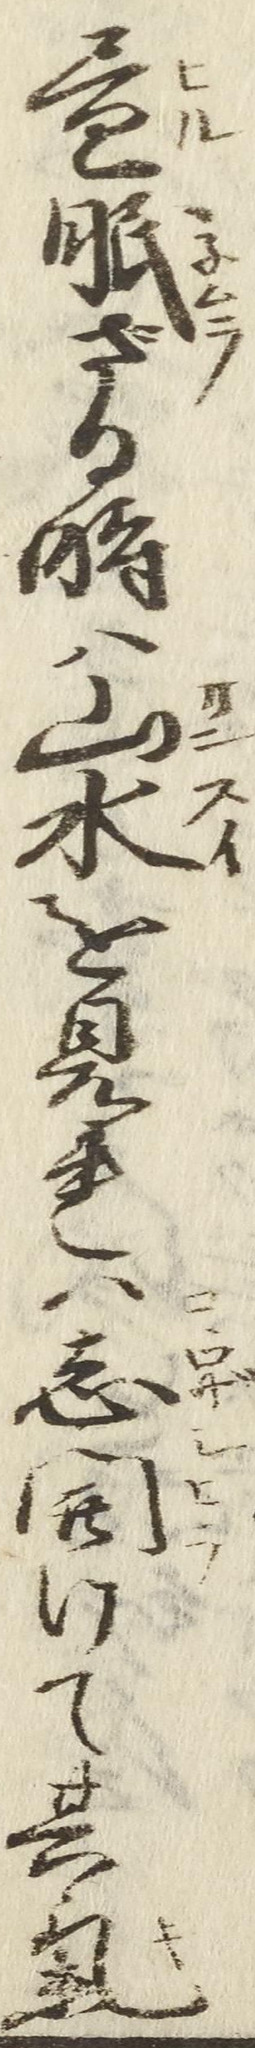昼眠ざる時は山水を見れは志開けて其気
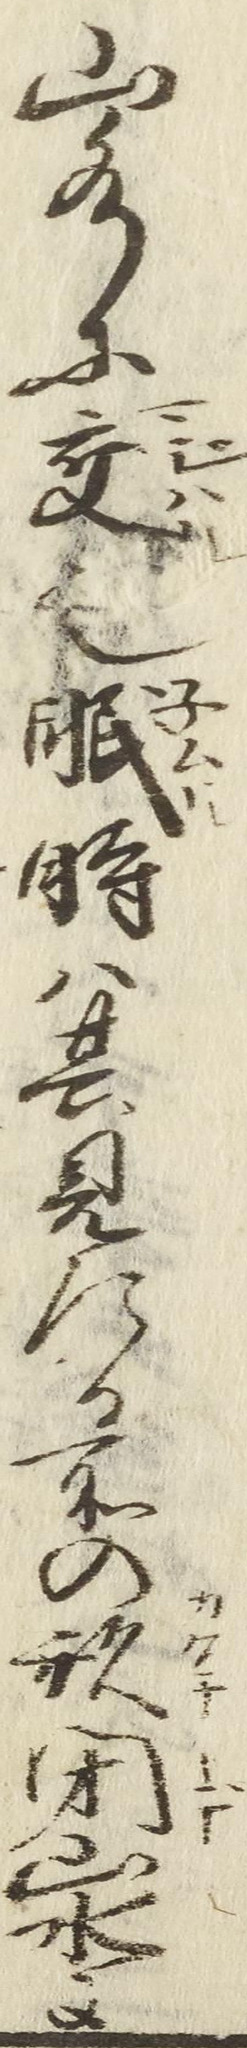山水に交也眠時は其見たる所の形閉山水に
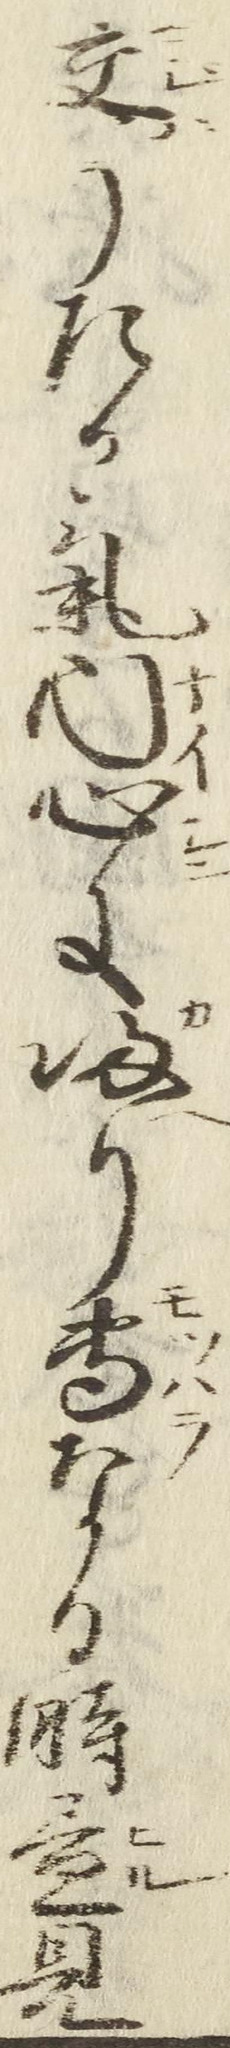交りたる気内心に帰り専なる時昼見
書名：天地或問珍　地
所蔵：東京大学地震研究所図書室 Earthquake Research Institute Library, The University of Tokyo, JAPAN
